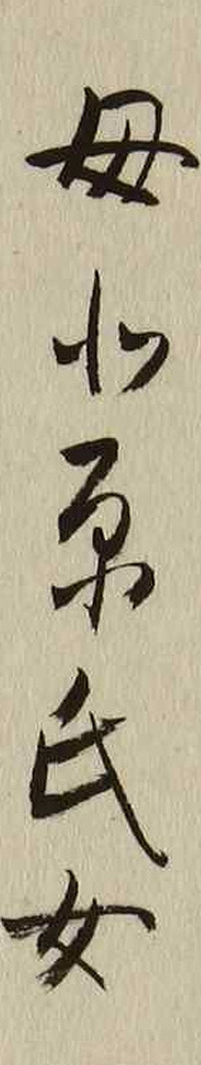母北原氏女
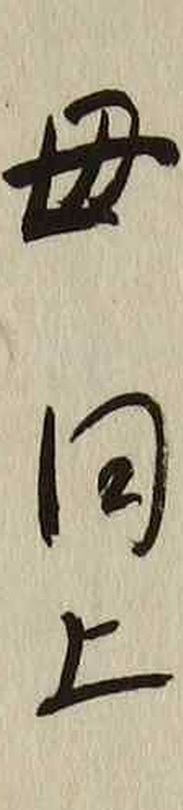母同上
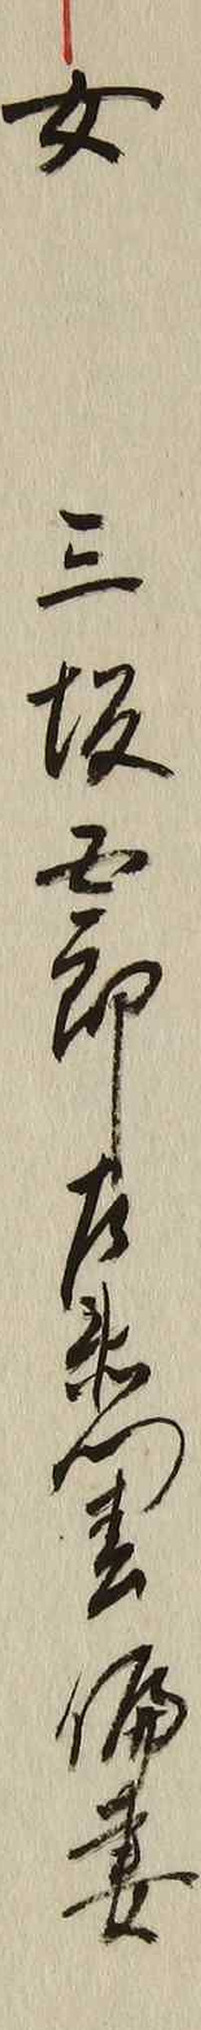女三坂五郎左衛門春偏妻
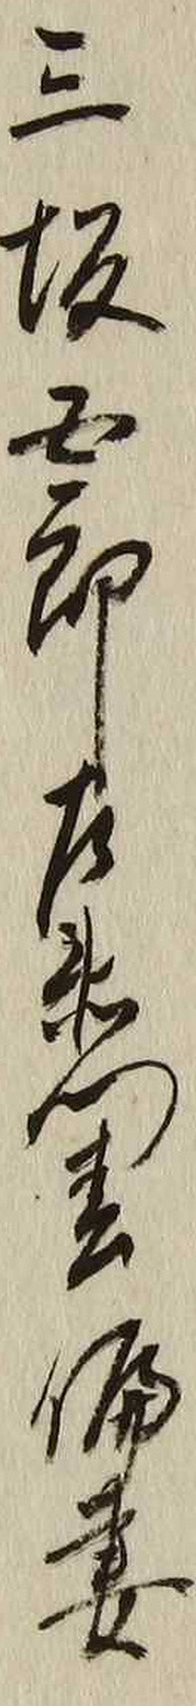女三坂五郎左衛門春偏妻
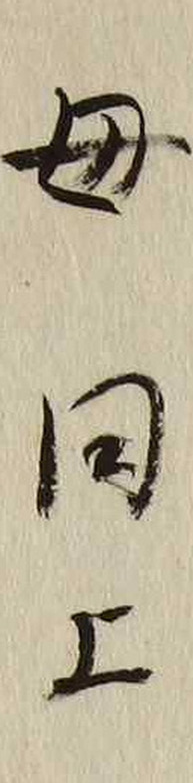母同上
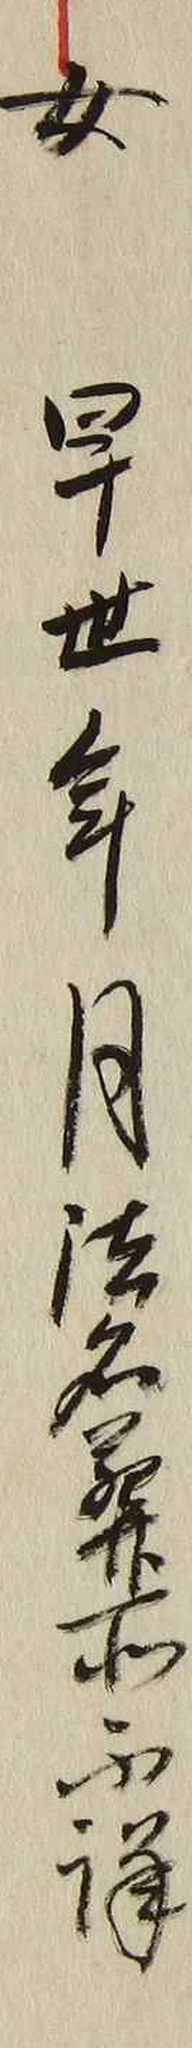女早世年月法名葬所不詳
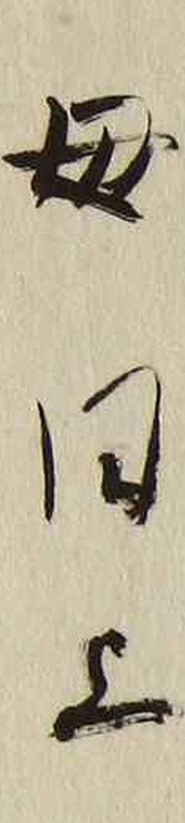母同上

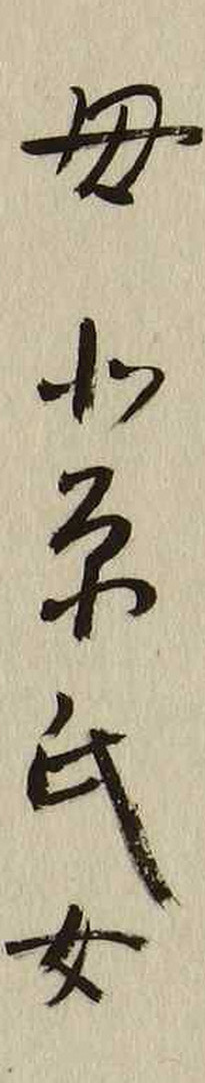母北原氏女
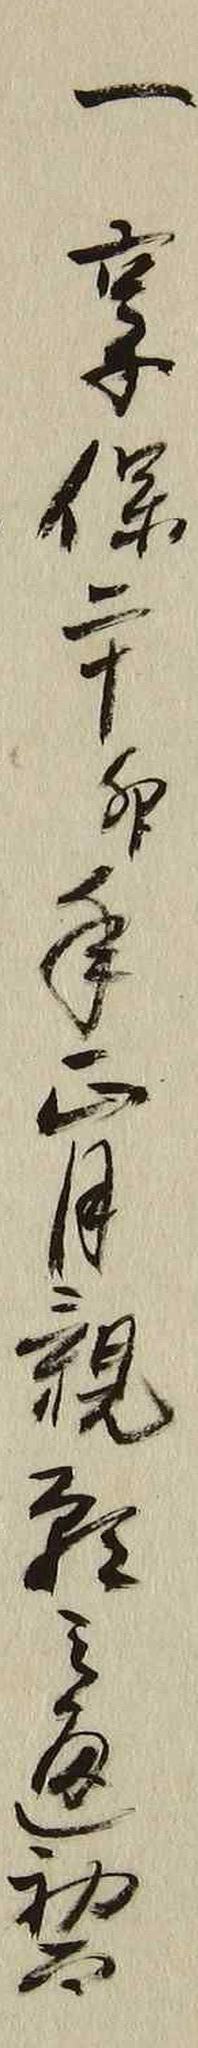一享保二十卯年正月親願之通初而
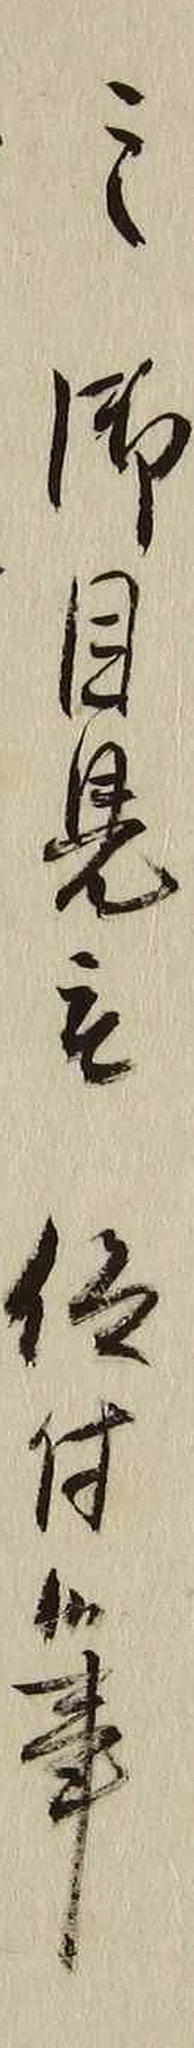之御目見被仰付候事
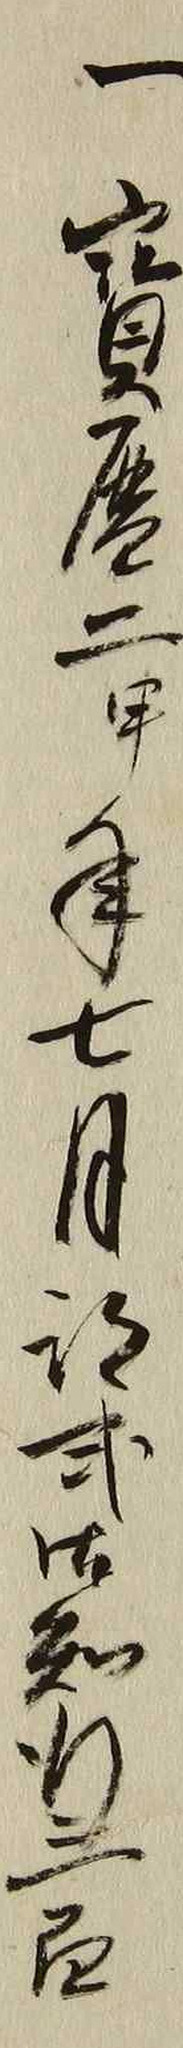一宝暦二申年七月跡式御知行三百
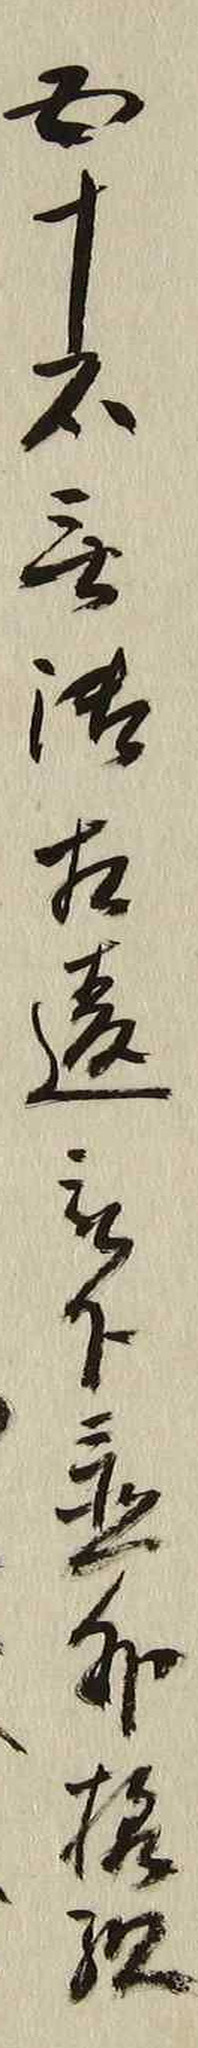五十石無御相違被下置外様組
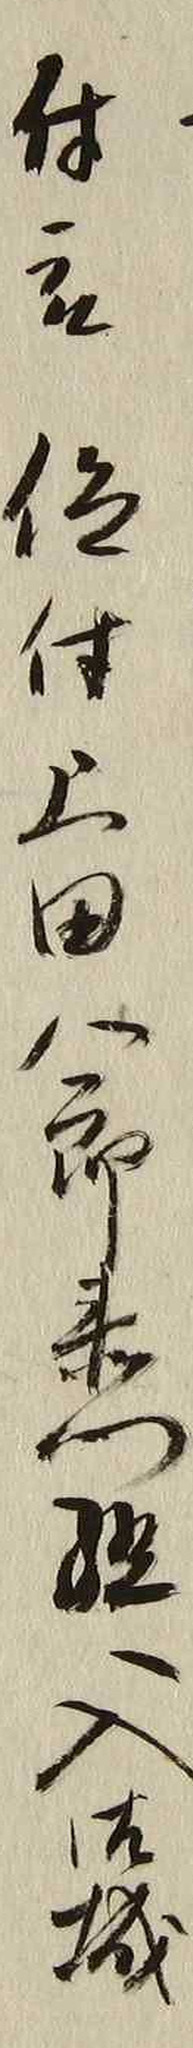付被仰付上田八郎衛門組へ入御城
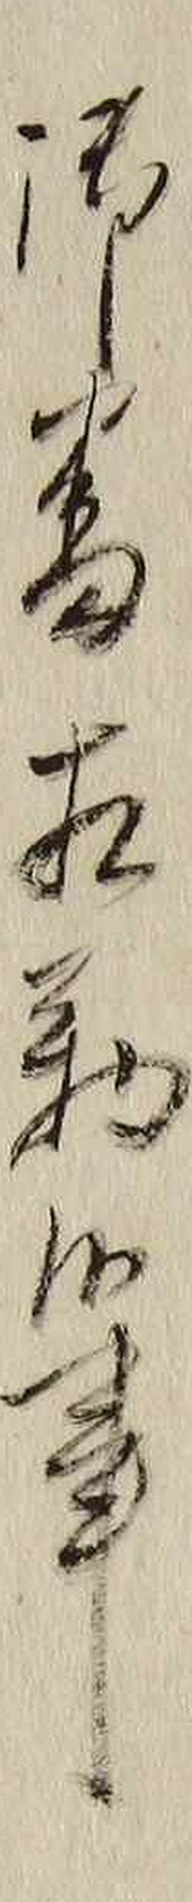御番相勤候事
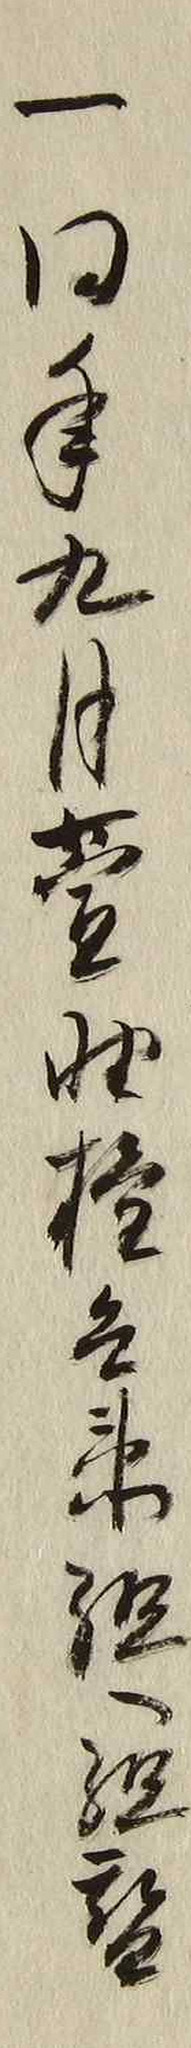一同年九月萱野権兵衛組へ組替
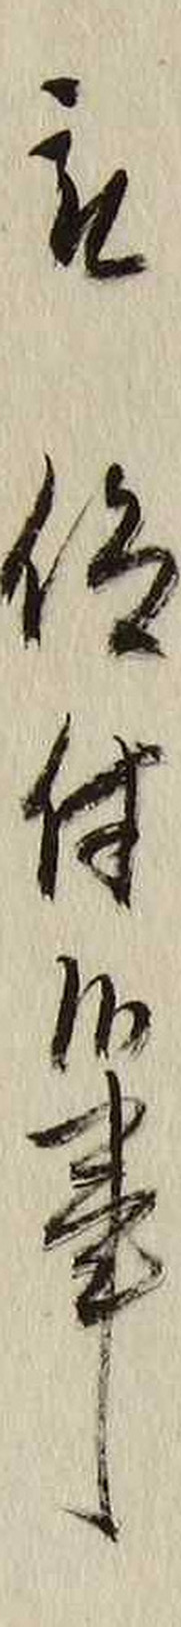被仰付候事
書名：諸士系譜　巻之349　も之部5
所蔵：会津若松市立会津図書館
